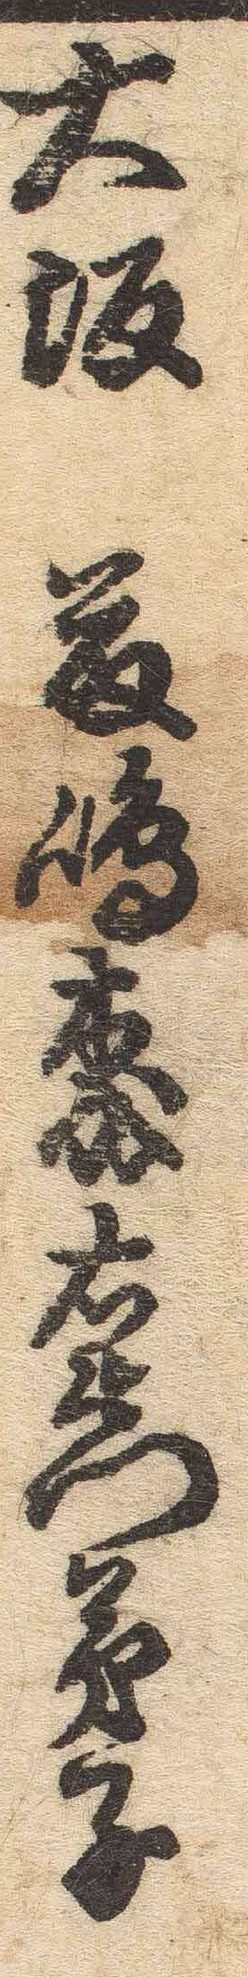大阪藤嶋森右衛門弟子
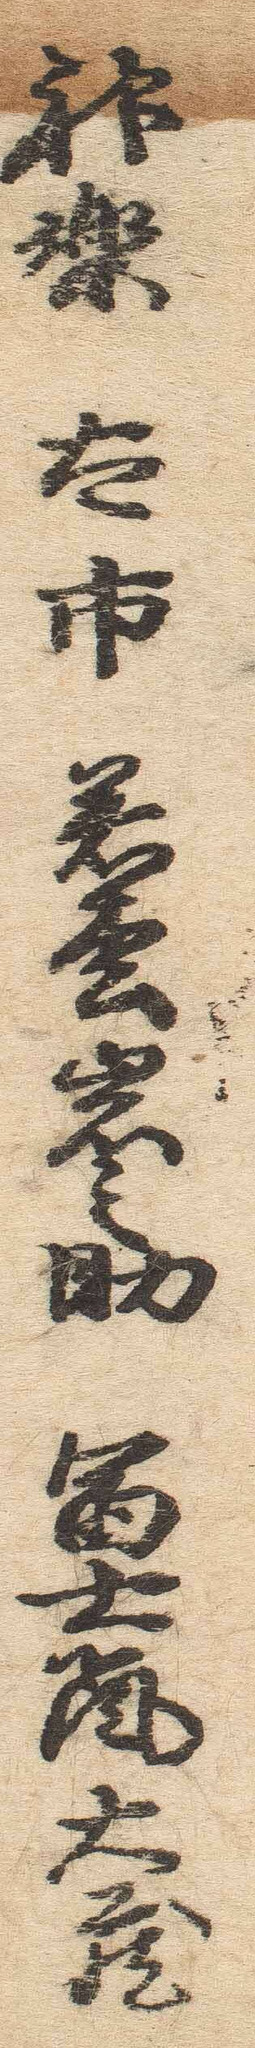神楽太市若松岩之助富士嵐大蔵
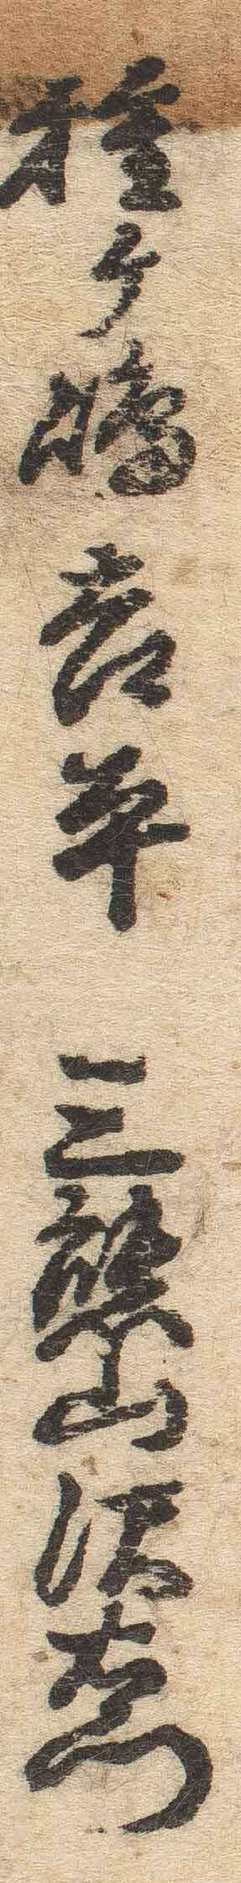種ケ嶋吉平三熊山沢右衛門
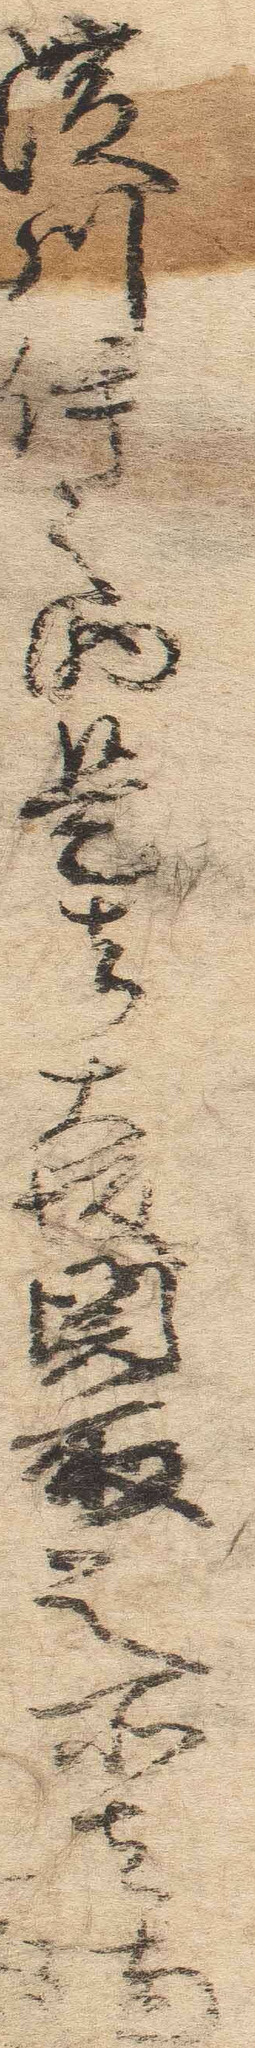淀川伊之助是は大阪関取也所は南
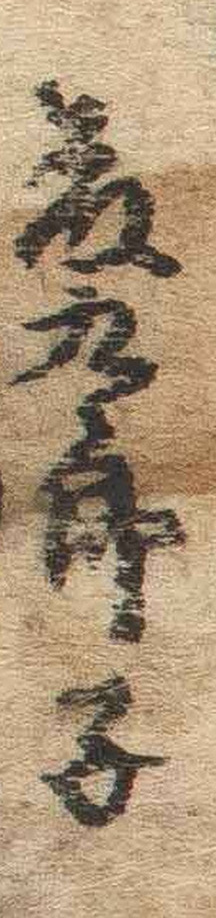藤九郎子
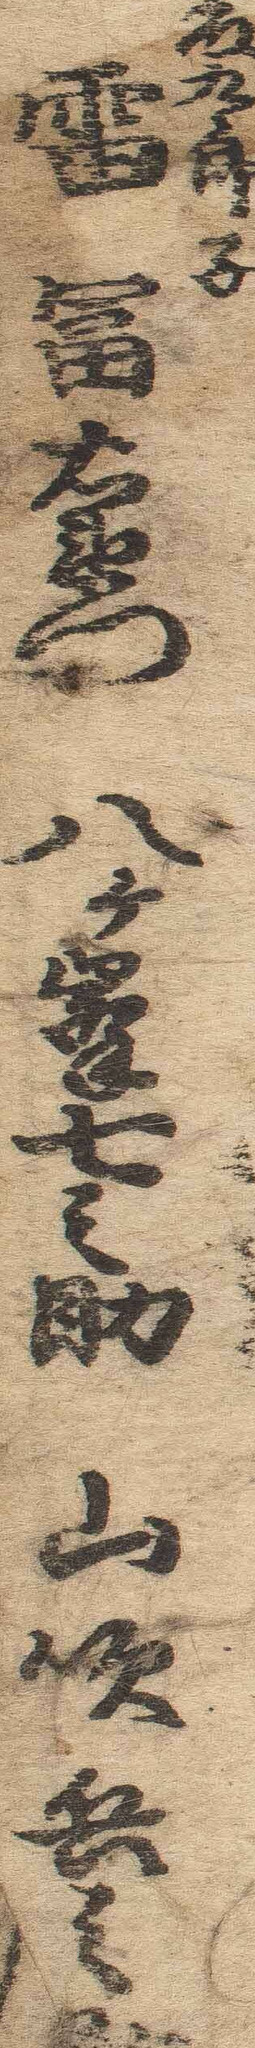雷冨右衛門八ケ峰七之助山吹兵之助

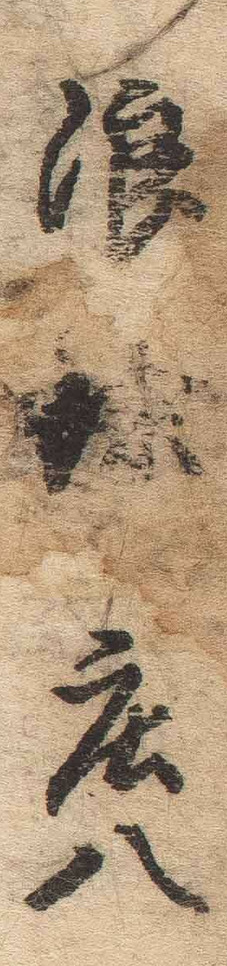浪除庄八
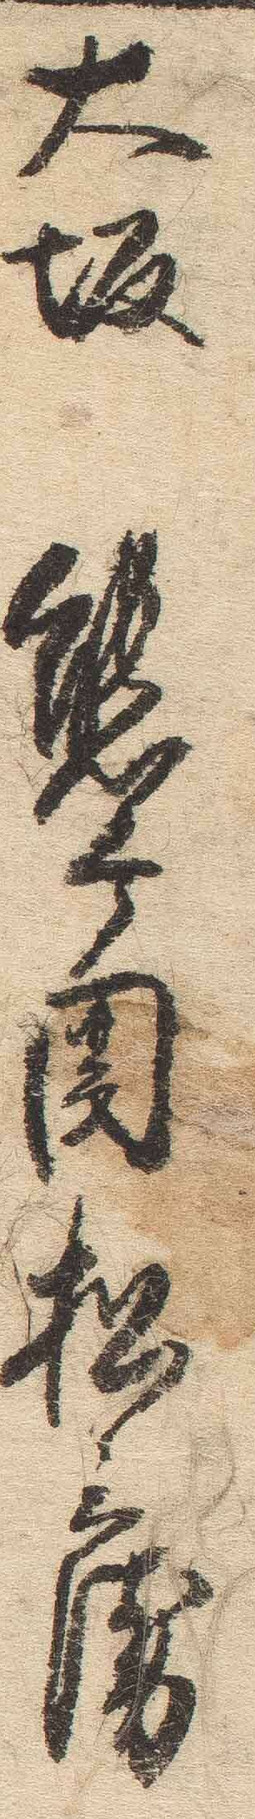大阪熊ケ関松兵衛
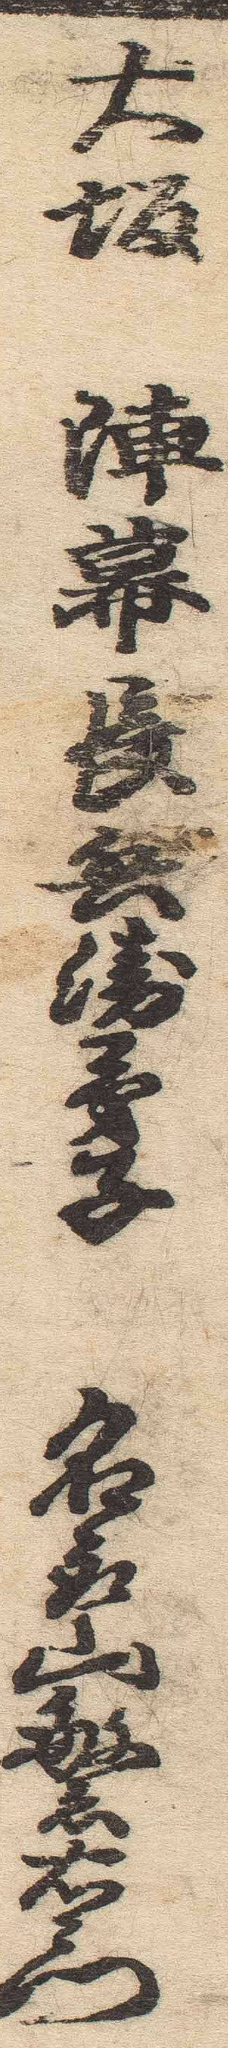大様陣幕長兵衛弟子名取山繁右衛門
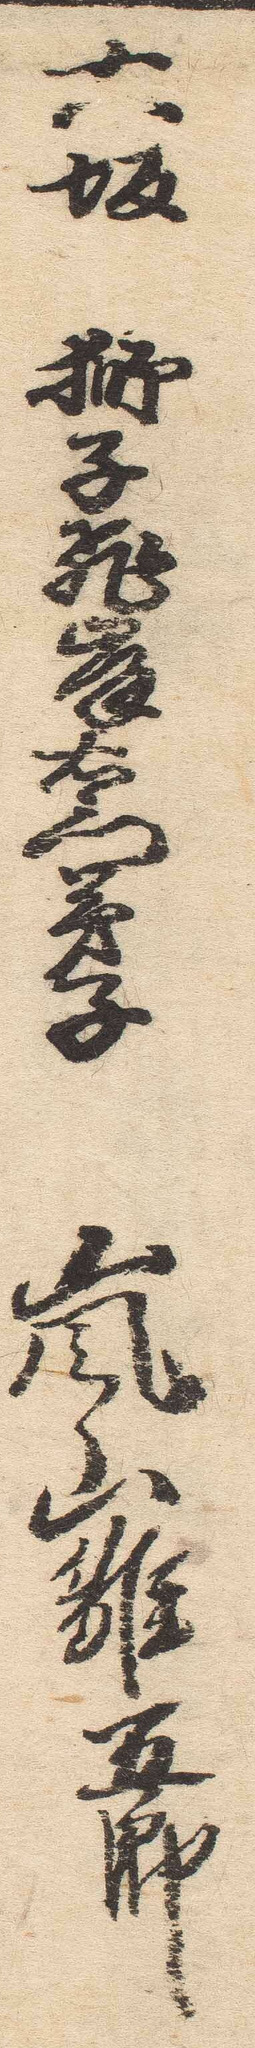大様獅子蔵峯右衛門弟子嵐山雛五郎
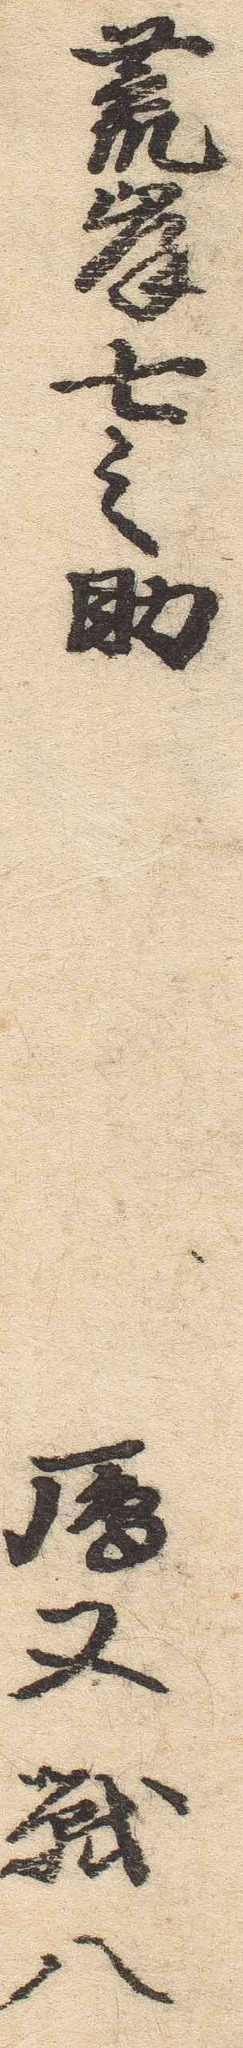荒峯七之助雁又戦八
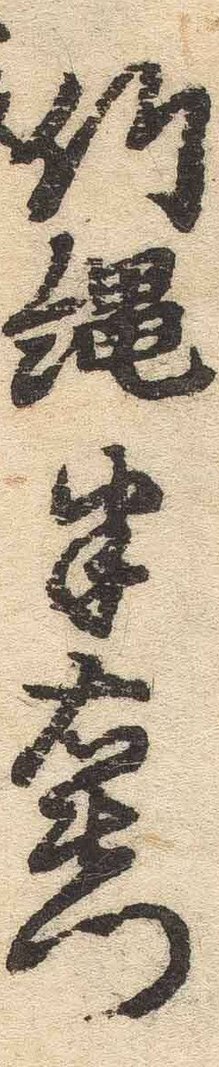竹縄半右衛門
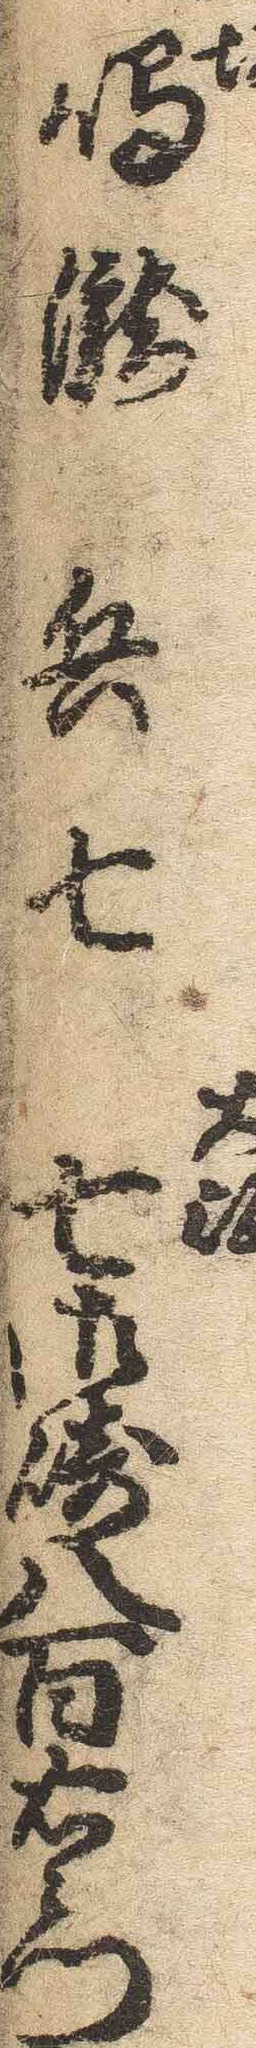鳴瀧兵七七御崎八百右衛門
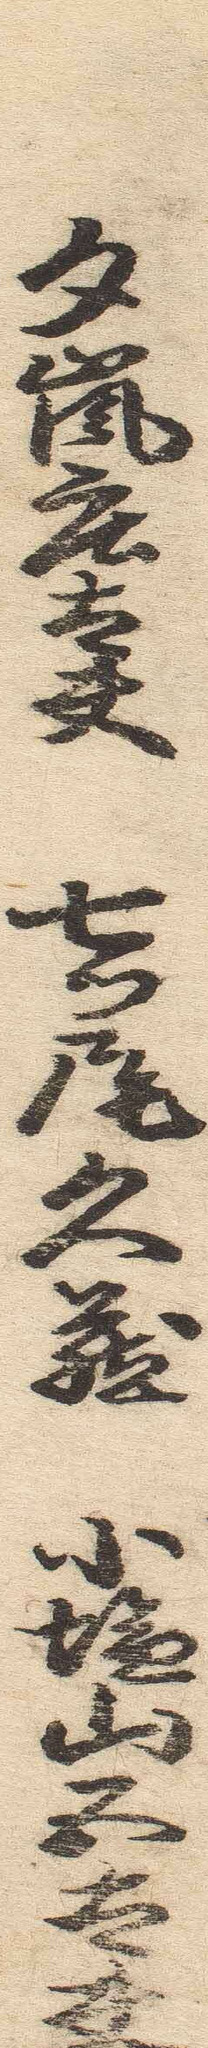夕嵐庄太夫七ツ尾久蔵小塩山五太夫
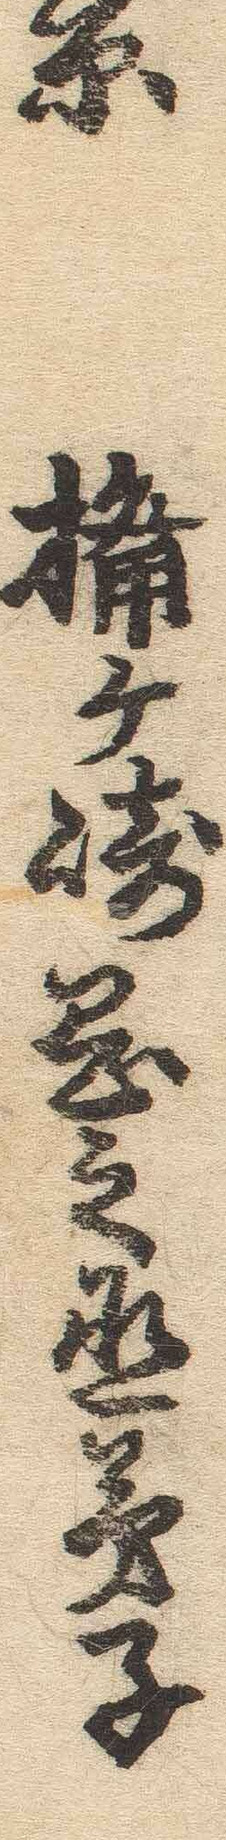京楯ケ崎岡之丞弟子
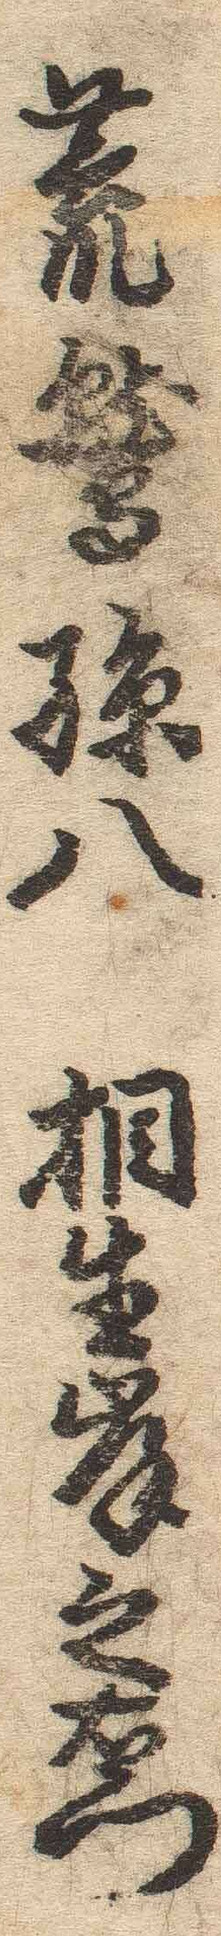荒鷲孫八相生峯之右衛門
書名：古今相撲大全
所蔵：東京学芸大学附属図書館 国文学研究資料館
